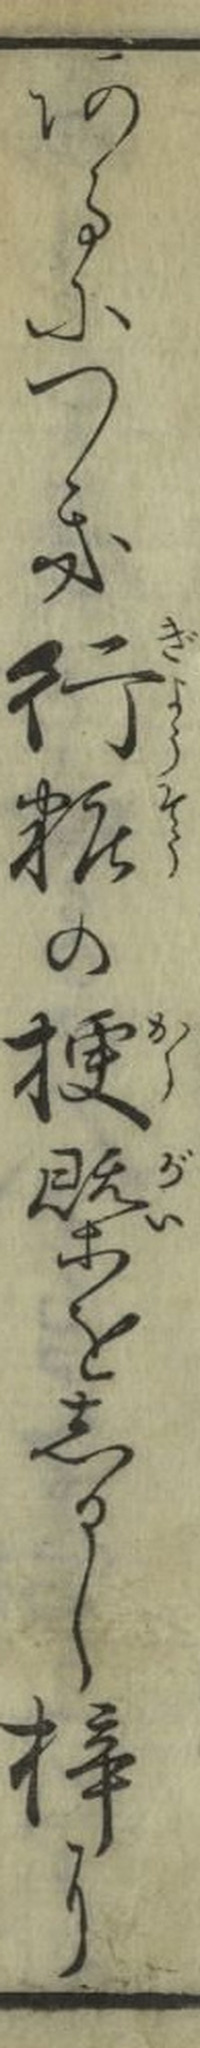あるにつき行粧の梗概をしるし梓に

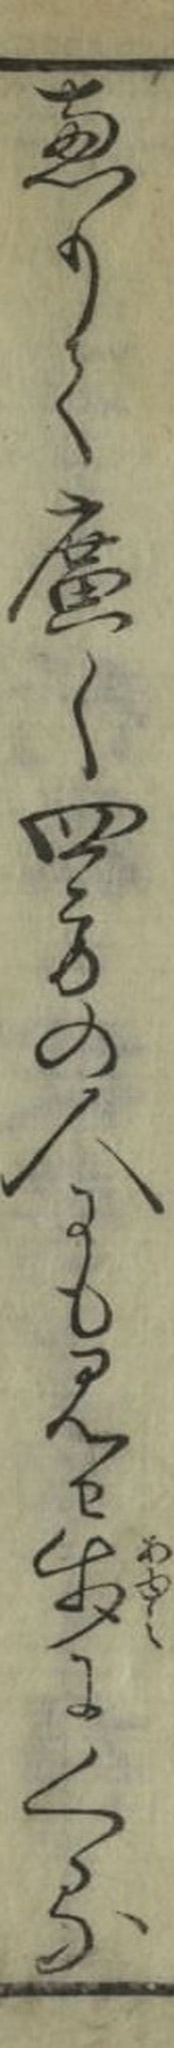ゑりて広く四方の人にも見せ歩にくる
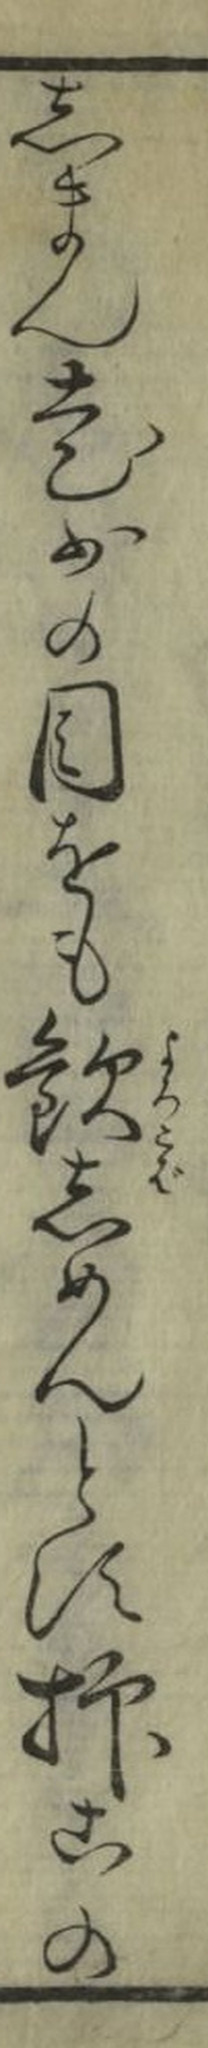しまん老小の目をも歓しめんとす抑この
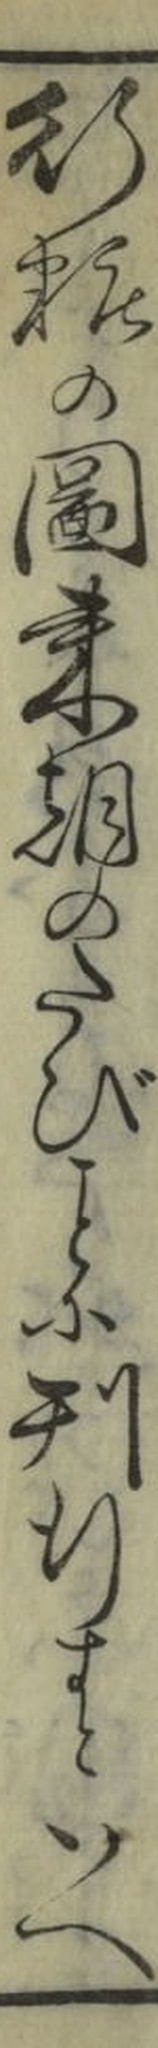行粧の図来朝のたびことに刊行すといへ
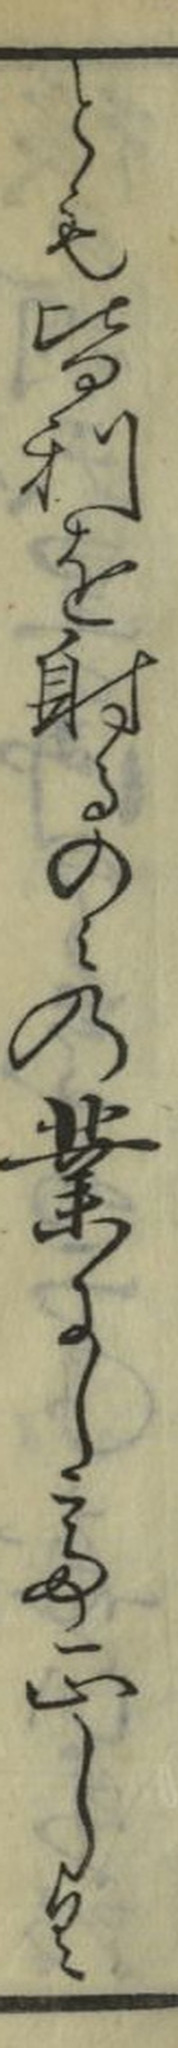とも皆利を射るのみの業にして正しく
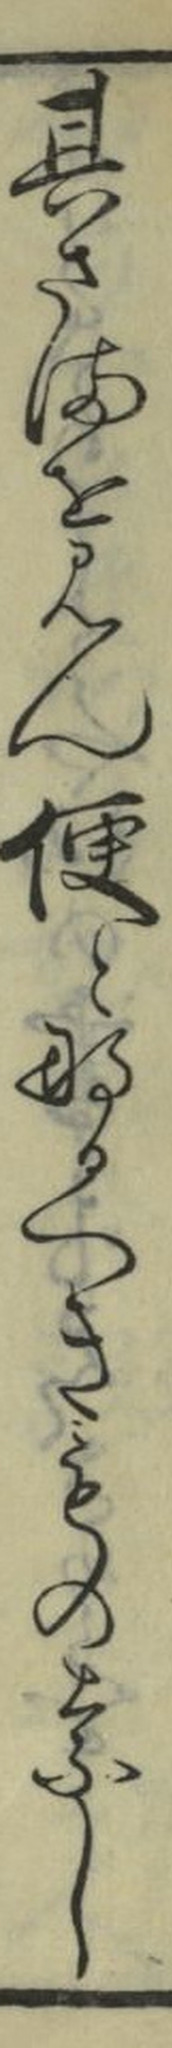其さまを見ん便となるへきものなし
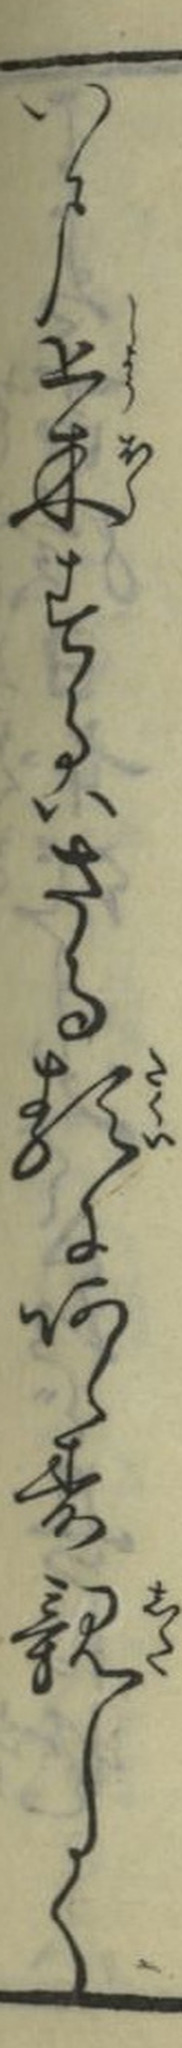いま上来するはさる類にあらす親しく
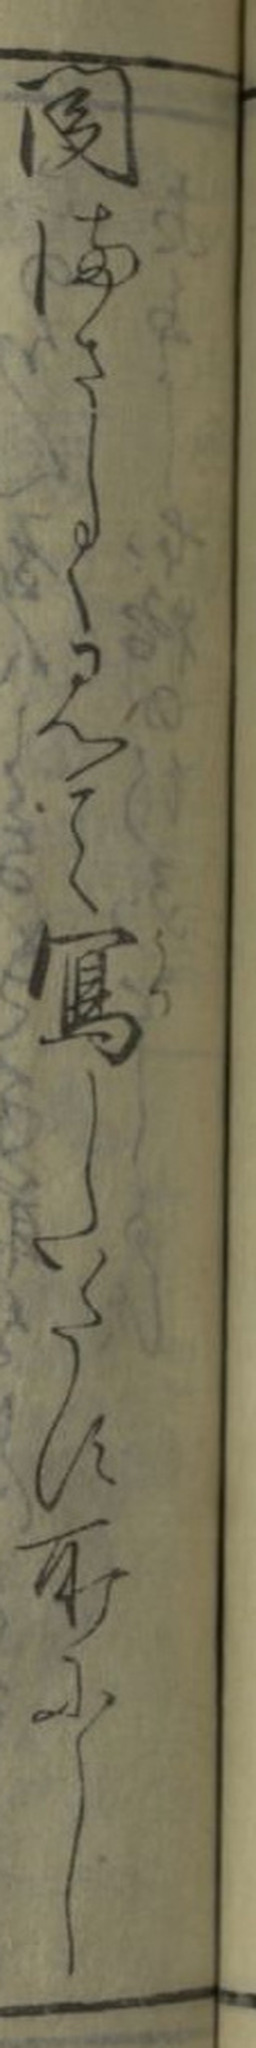聞まさしく見て写しいたす所にし
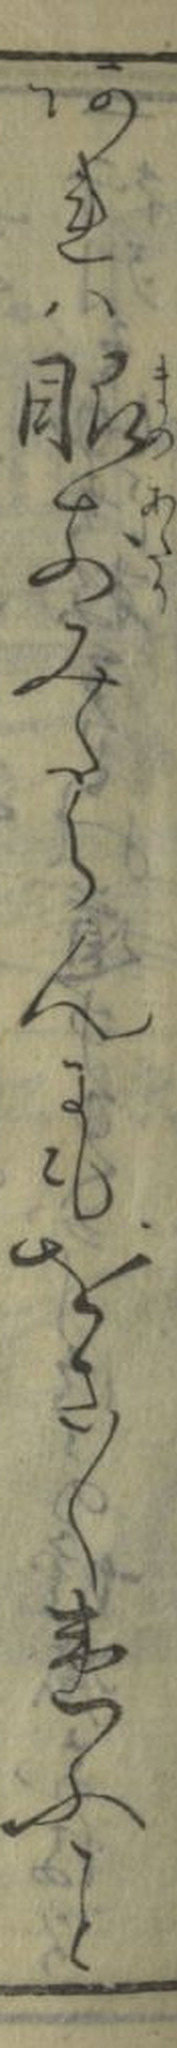あれは眼前みたらんにもをさ〳〵違ふこと
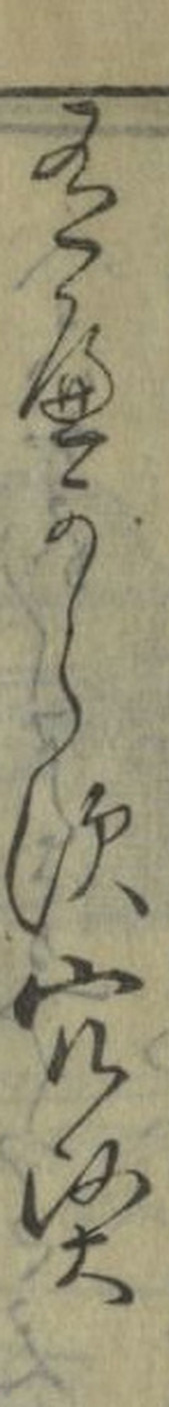有へからす穴賢
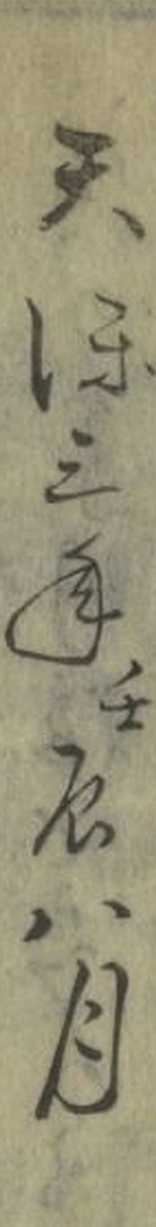天保三年壬辰八月
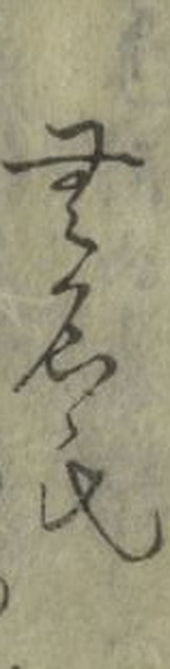無名氏

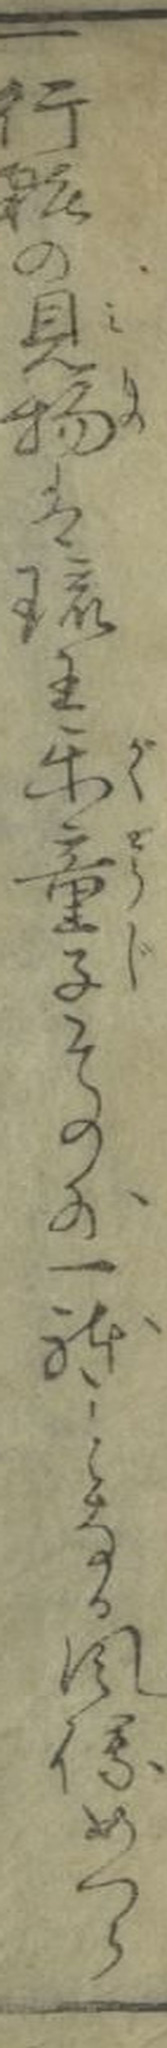一行粧の見物は琉王楽童子その外一体ことなる風儀めつら
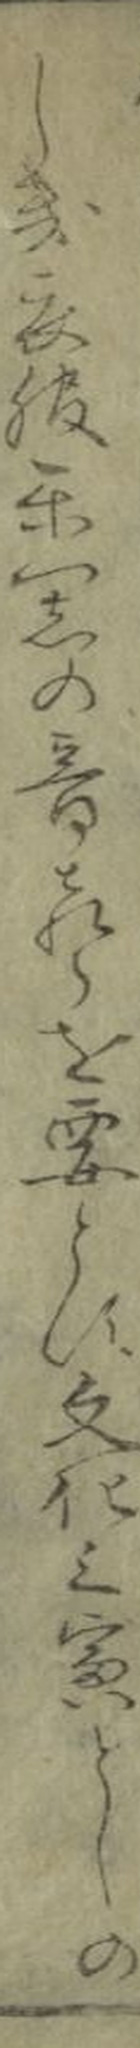しき衣服楽器の音声を要とす文化三寅としの
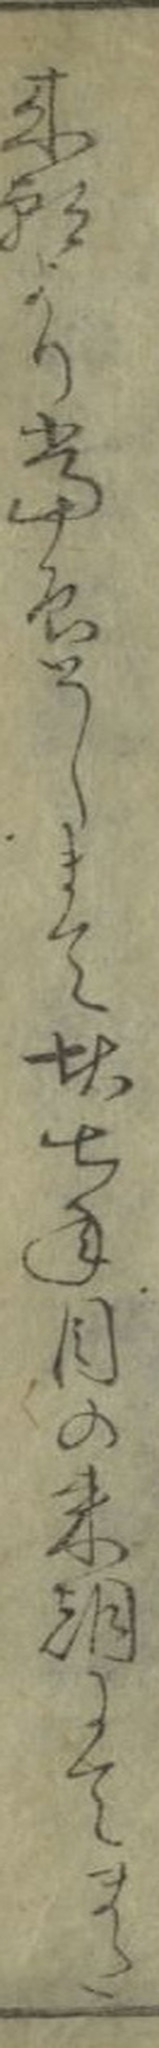来朝より当辰としまて此七年目の来朝にてまた
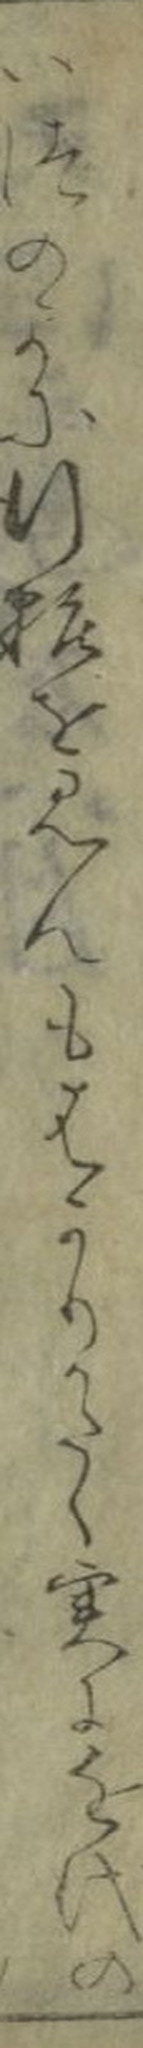いつのまに行粧を見んもはかりかたく実に近代の
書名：琉球人行列記
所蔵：University of the Ryukyus Library
